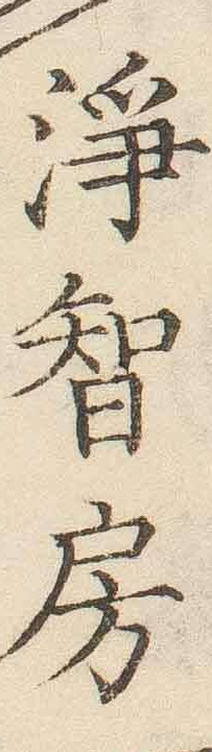淨智房
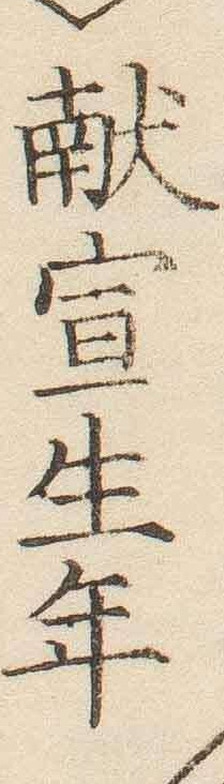献宣生年
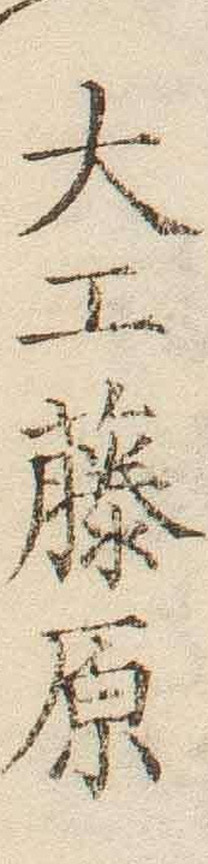大工藤原

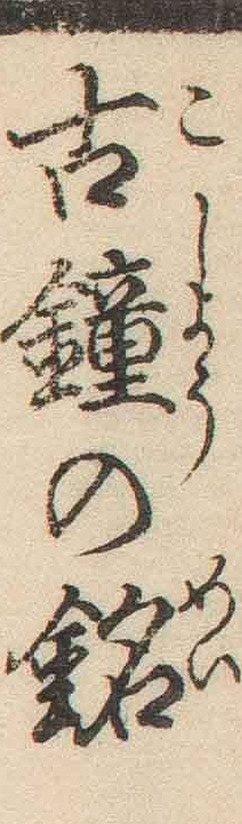古鍾の銘
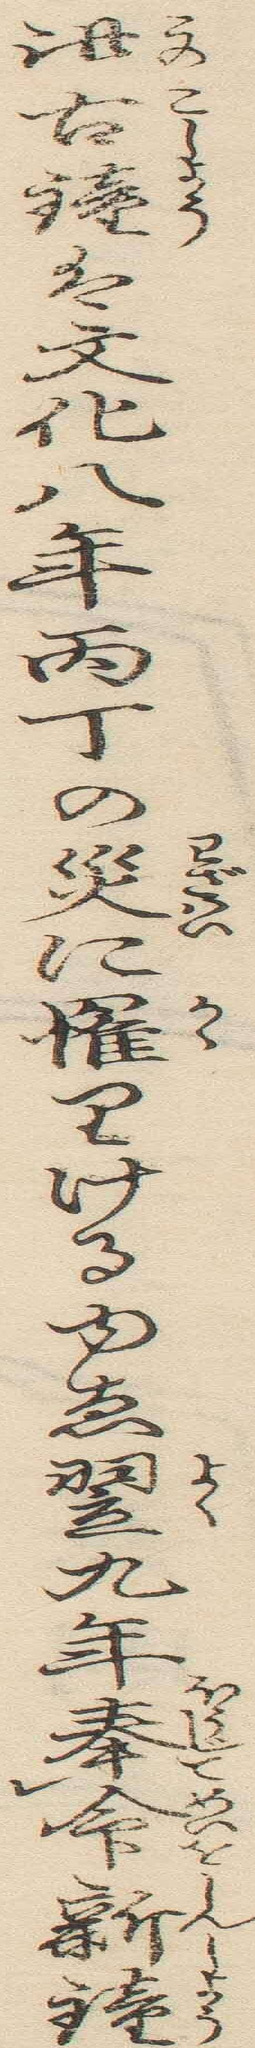此古鍾は文化八年丙丁の災に罹りけるゆゑ翌九年奉命新鍾
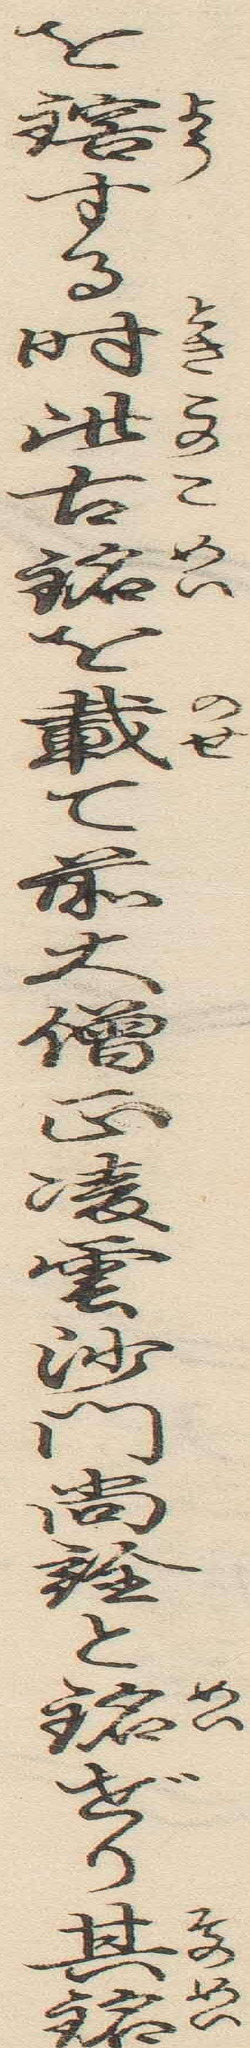を鎔する时此故銘を載て前大僧正凌雲沙門尚詮と銘ぜり其銘
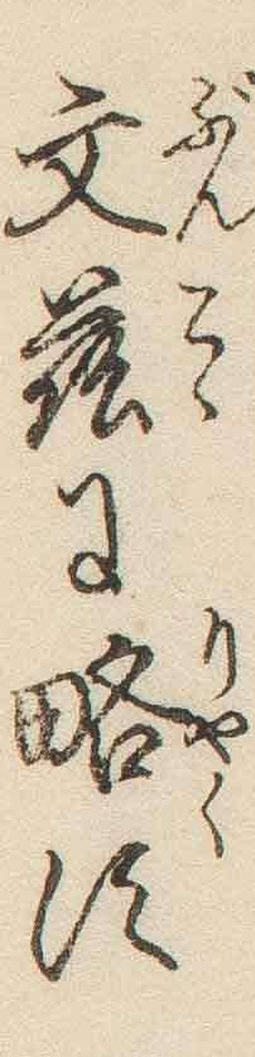文兹に略す
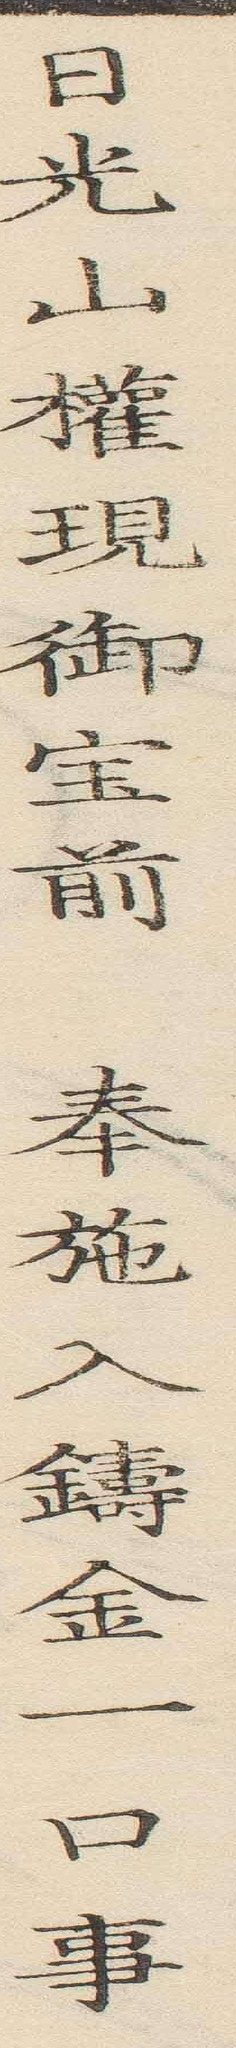日光山權現御宝前奉施入鑄金一口事
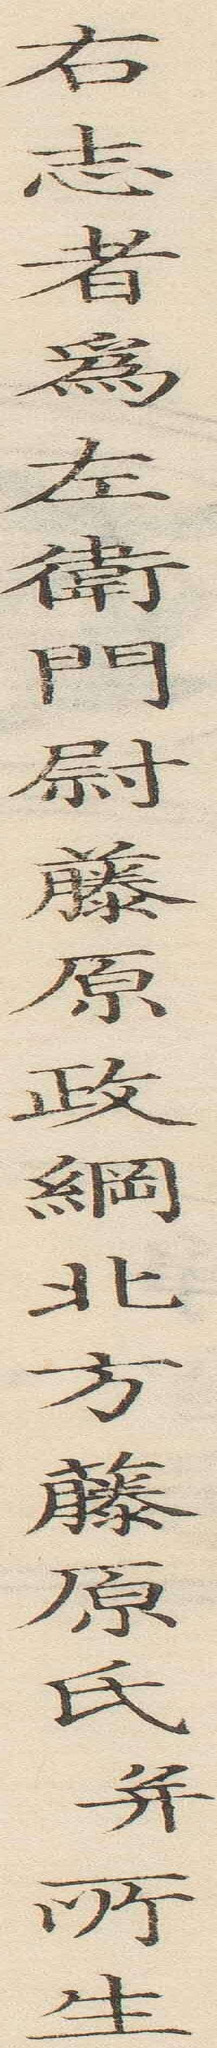右志者爲左衛門尉藤原政綱北方藤原氏并所生
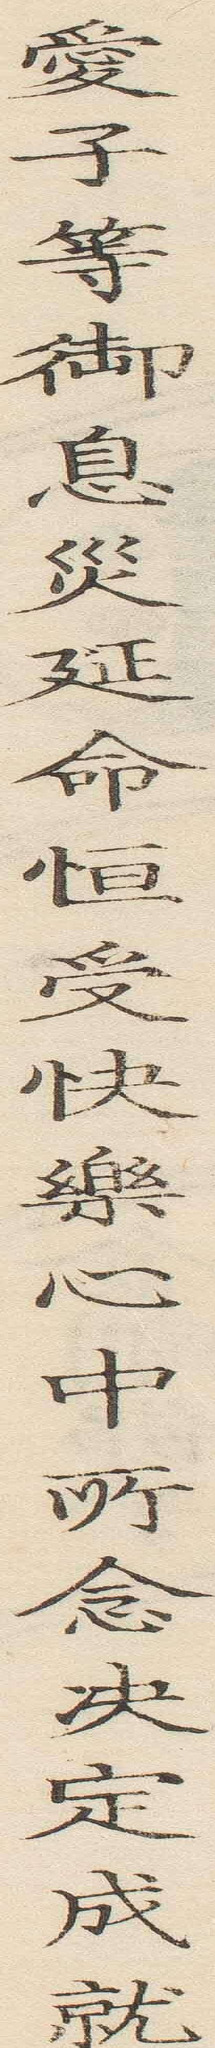愛子等御息災延命恒受快樂心中所念决定成就
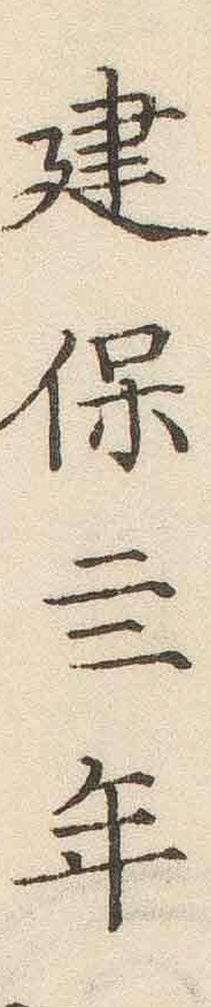建保亖年
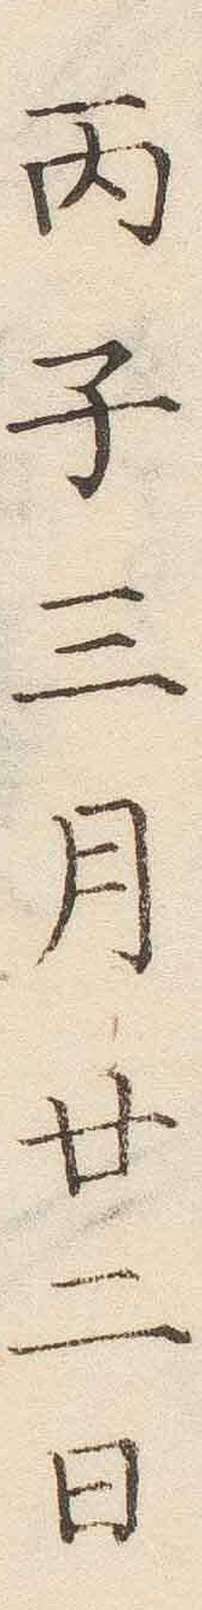丙子三月廿二日
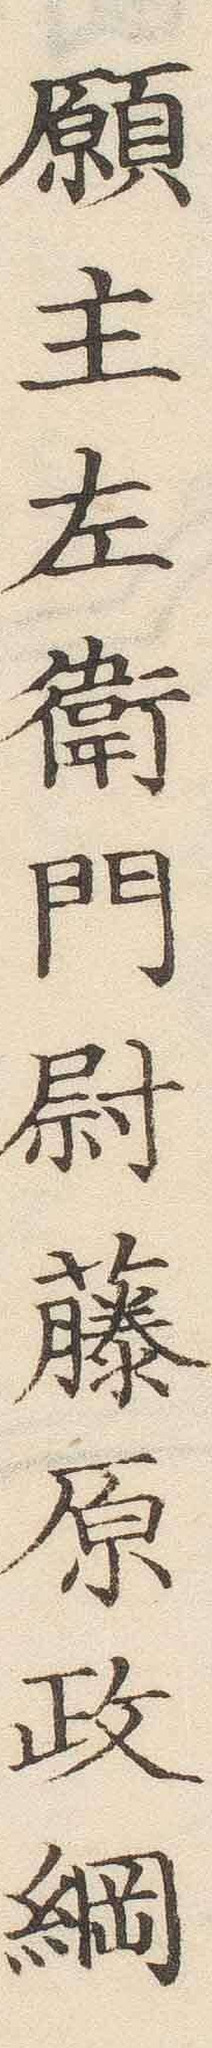願主左衛門尉藤原政綱
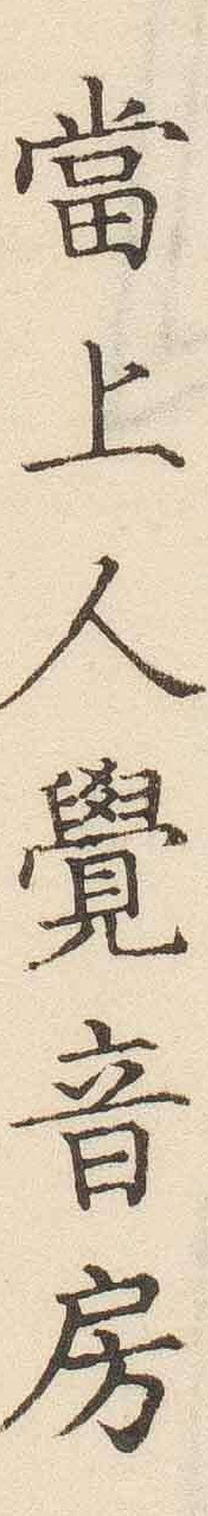當上人覺音房
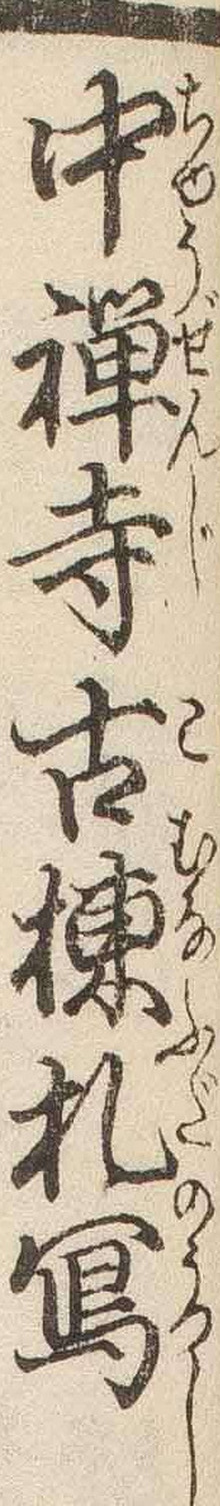中禅寺古棟札冩
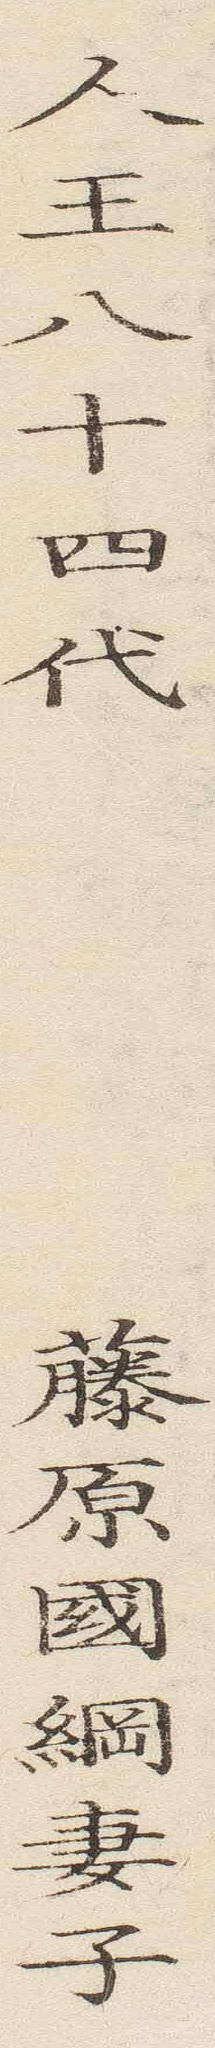人王八十四代藤原國綱妻子
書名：日光山志
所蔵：東京学芸大学附属図書館 国文学研究資料館
